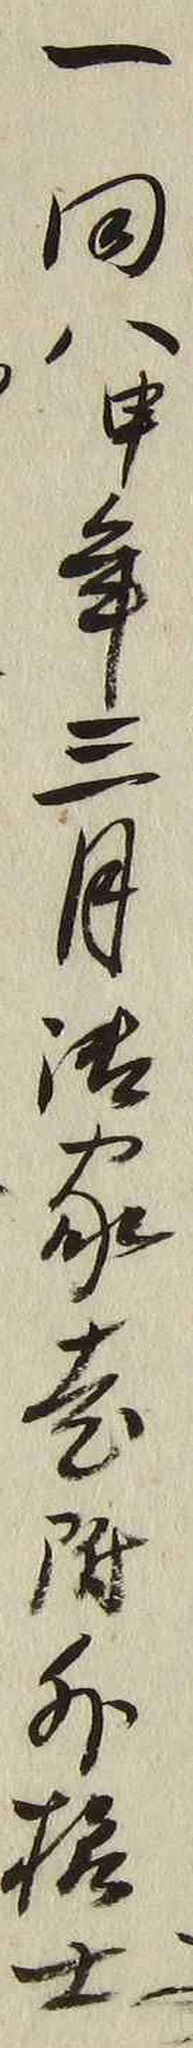一同八申年三月御家老附外様士
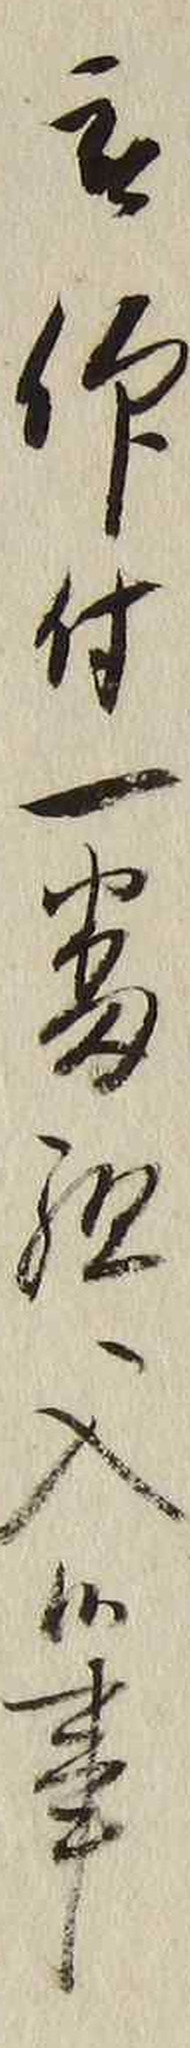被仰付一番組へ入候事
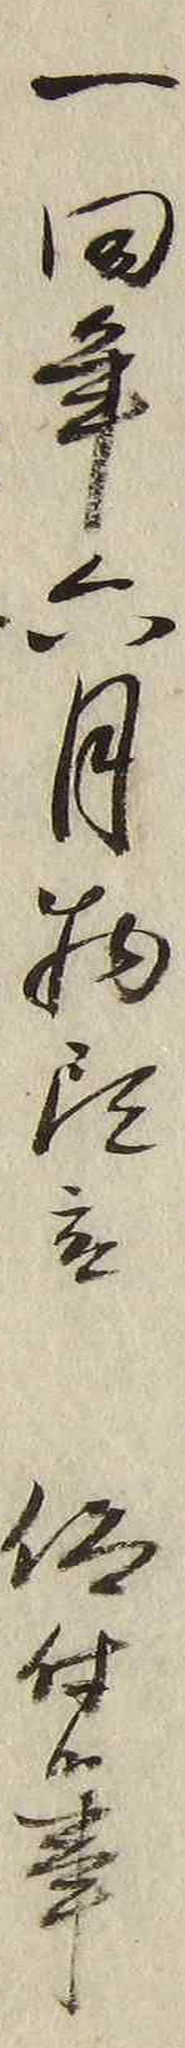一同年六月物頭被仰付候事
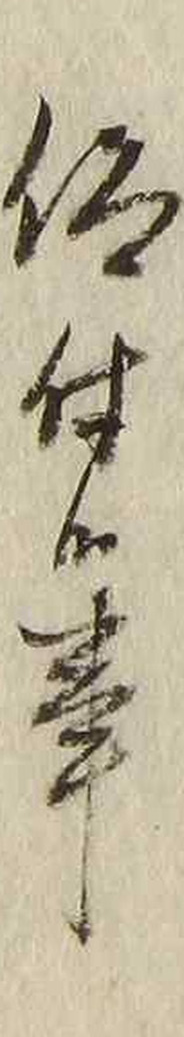仰付候事
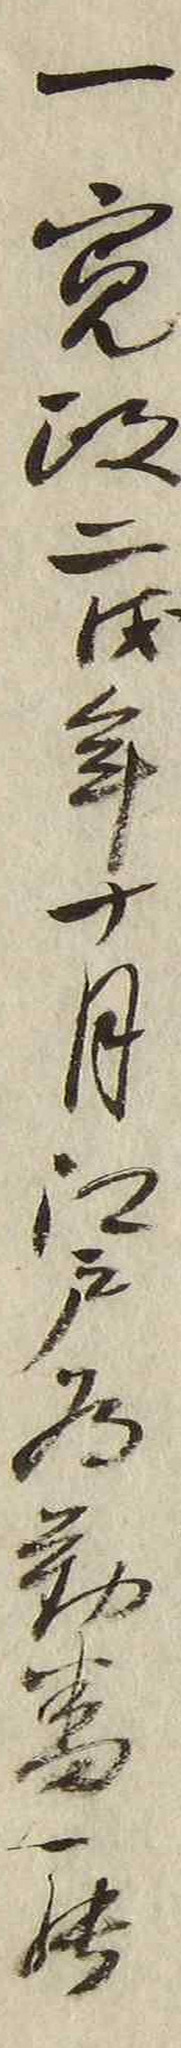一寛改二戌年十月江戸為勤番罷

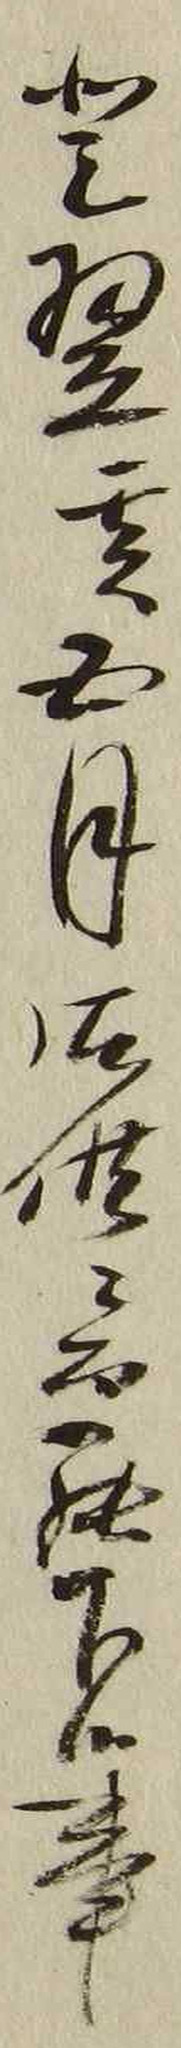登翌亥五月御供ニ而罷下候事
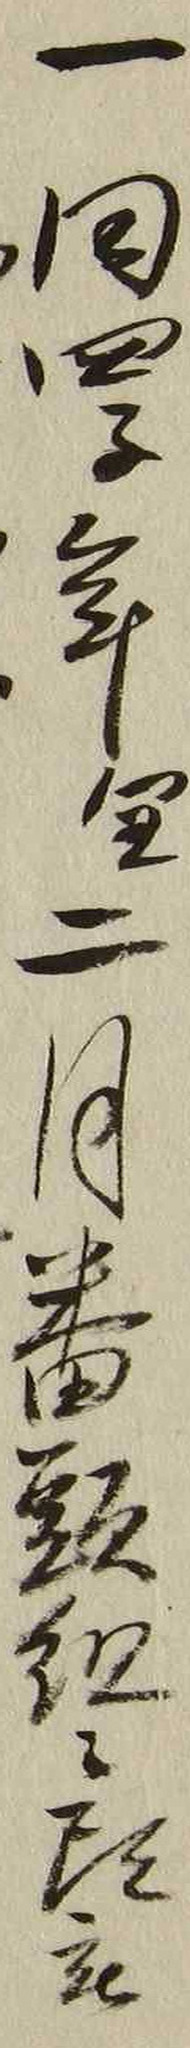一同四子年閏二月番頭組々頭被
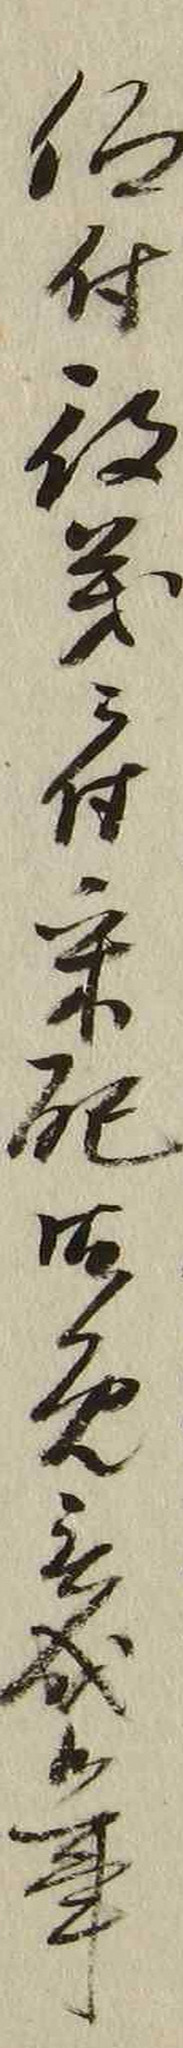仰付役義ニ付采配御免被成候事
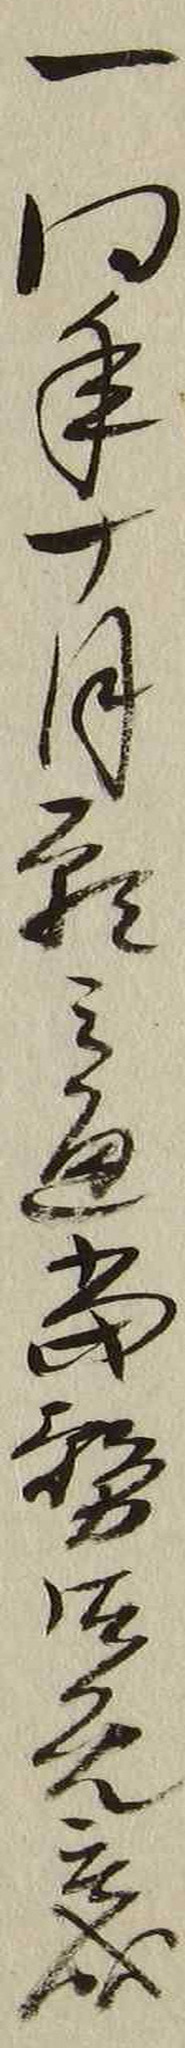一同年十月願之通当務御免被成
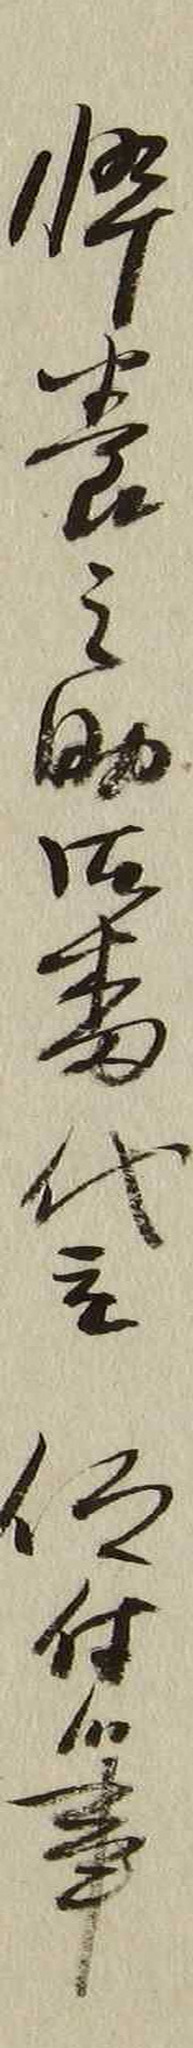忰養之助御番代被仰付候事
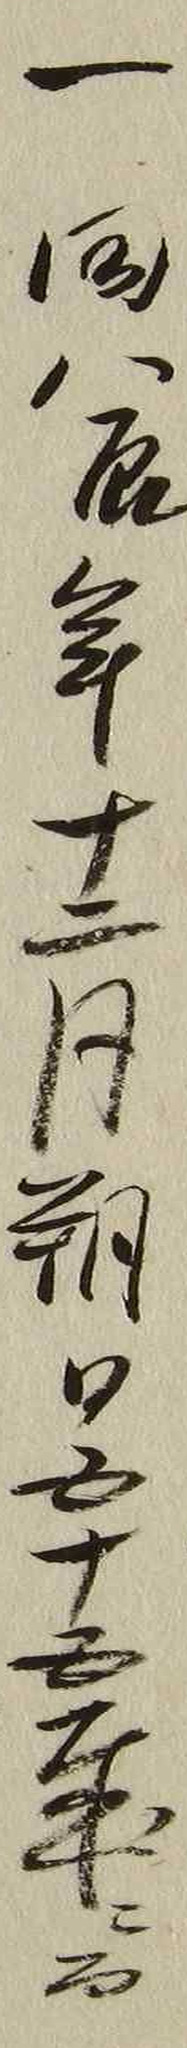一同八辰年十二月朔日五十五歳ニ而
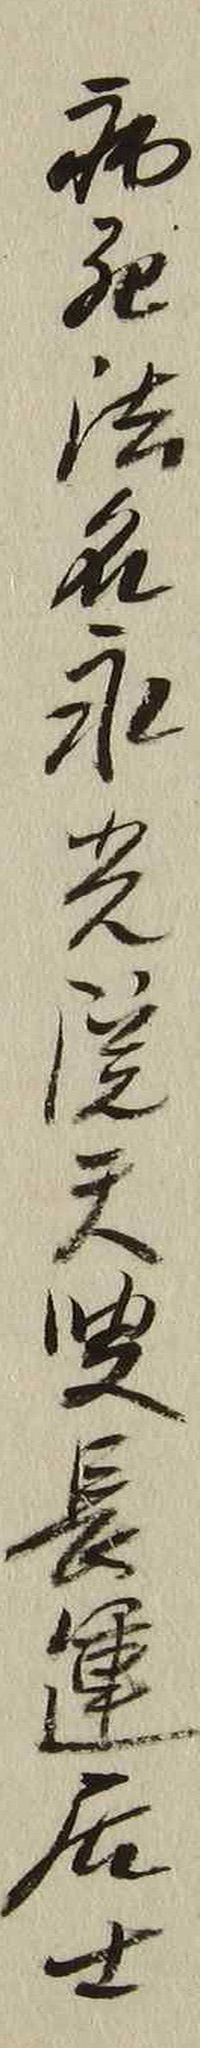病死法名永光院天叟長運居士
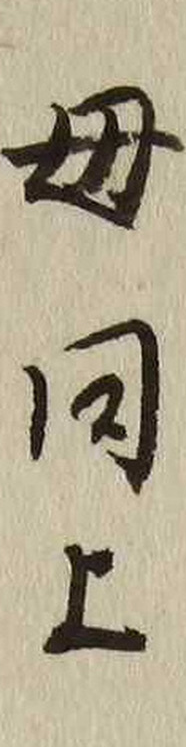母同上
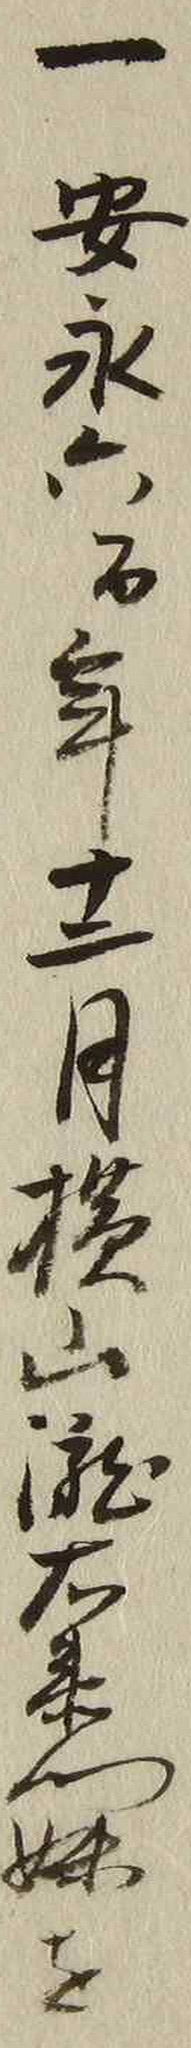一安永六酉年十二月横山瀧右衛門妹を
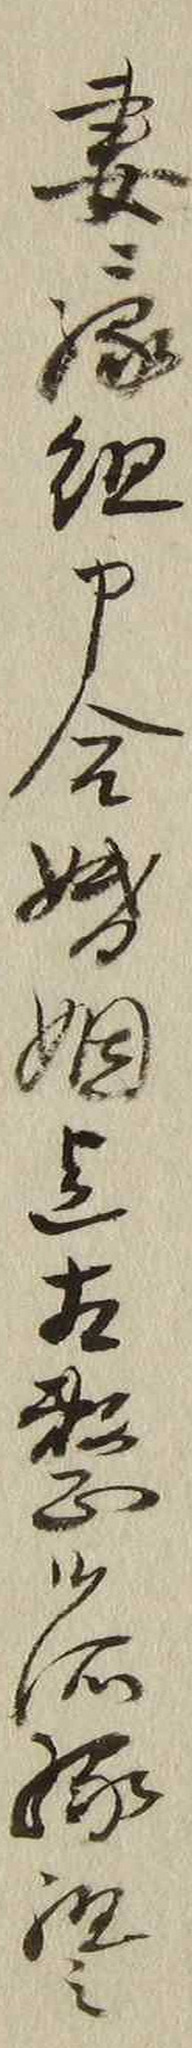妻ニ縁組申合婚姻迄相整候所縁組之
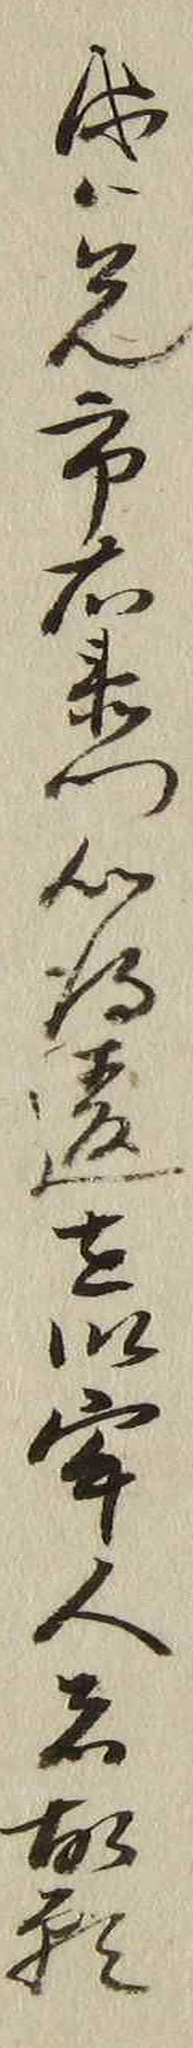儀ハ兄市右衛門心得違を以牢人者故願
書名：諸士系譜　巻之355　す之部5
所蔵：会津若松市立会津図書館
